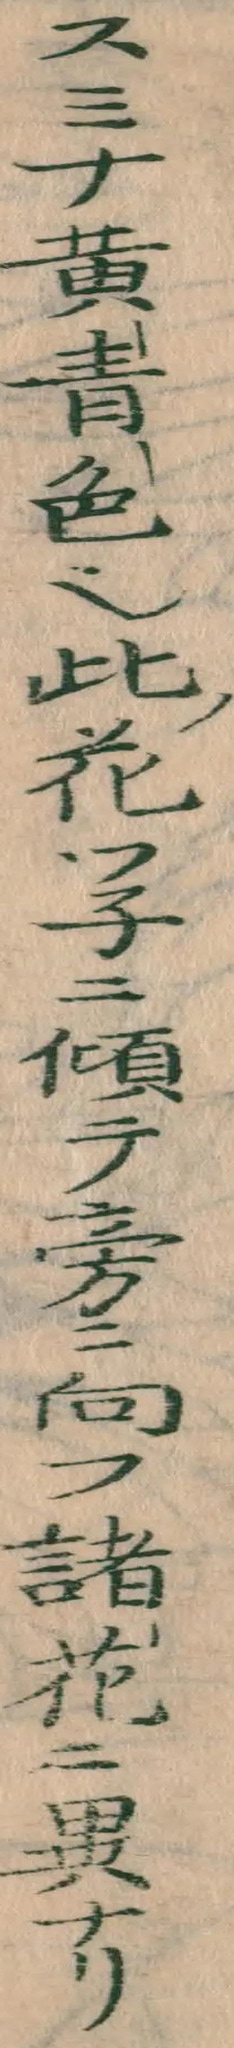スミナ黄-青-色也此花ツネニ傾テ旁ニ向フ諸-花ニ異ナリ
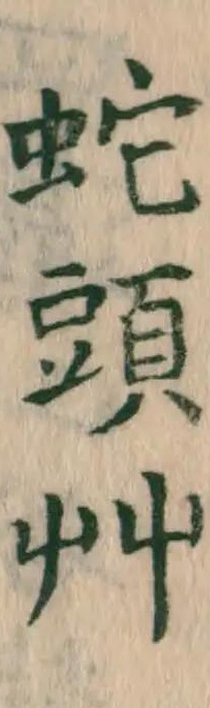蛇頭艸

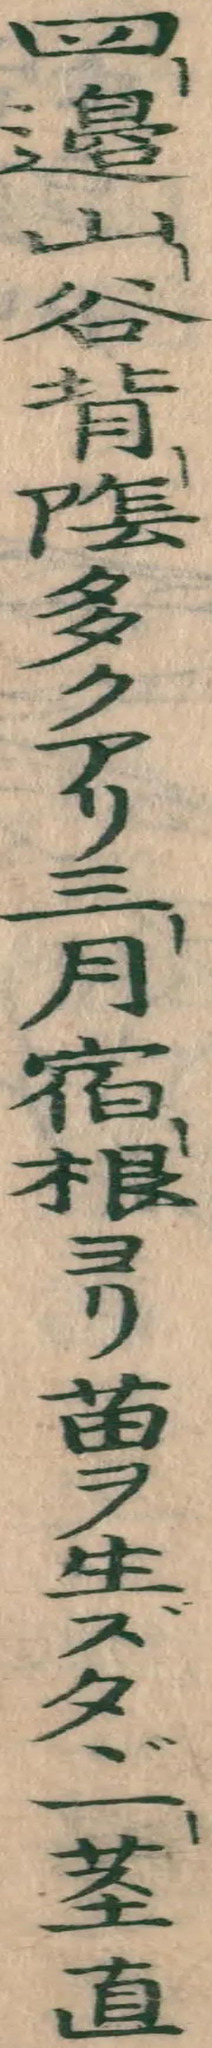四-辺山-谷背-陰多クアリ三-月宿-根ヨリ苗ヲ生ズタヾ一-茎直
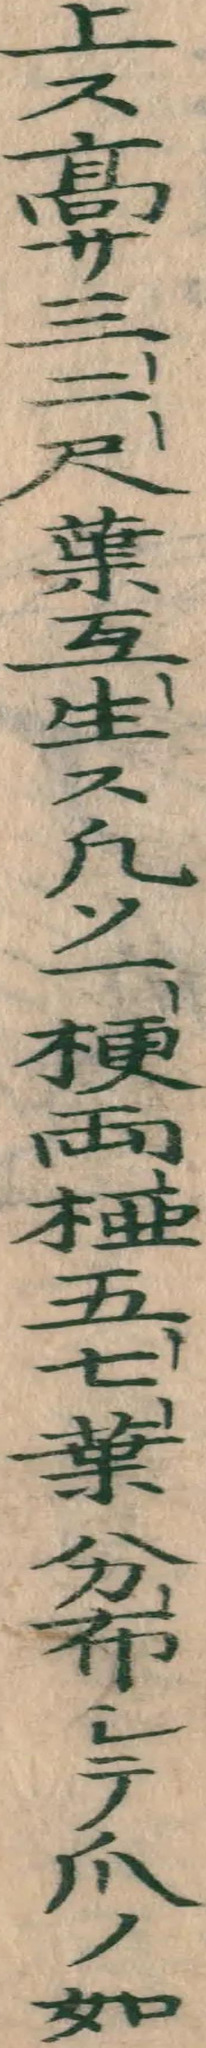上ス高サ三-二-尺葉互-生ス凡ソ一-梗両-椏五-七-葉分-布シテ爪ノ如
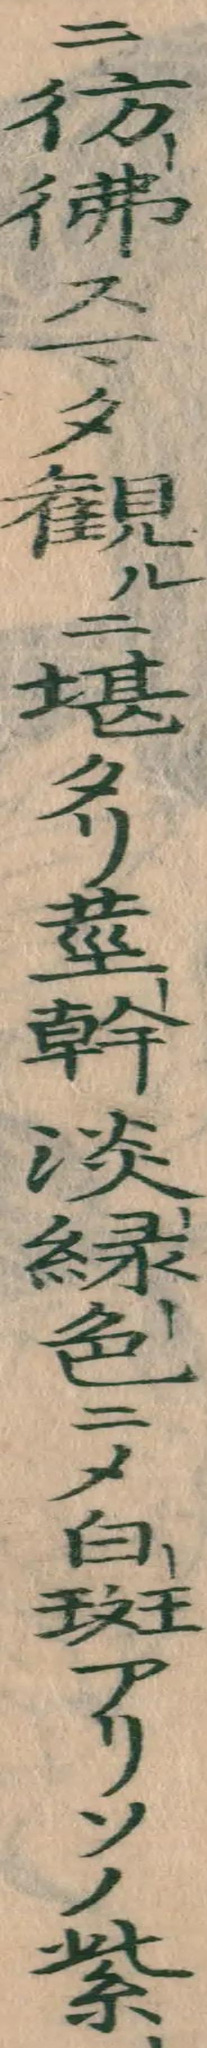ニ彷-彿スマタ観ニ堪タリ茎-幹淡-緑-色ニシテ白-斑アリソノ紫-
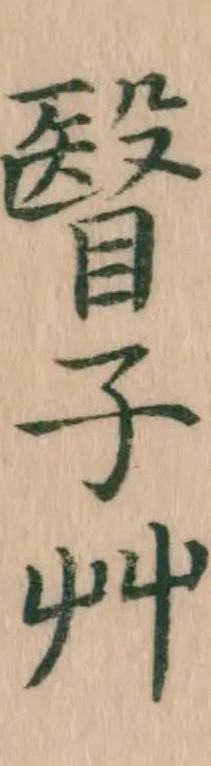瞖子艸

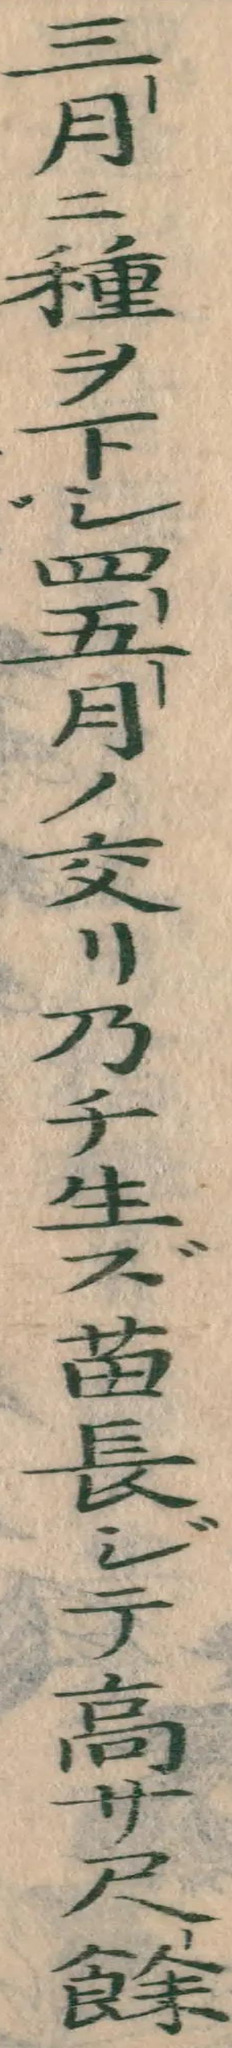三-月ニ種ヲ下シ四-五-月ノ交リ乃チ生ズ苗長ジテ高サ尺-余
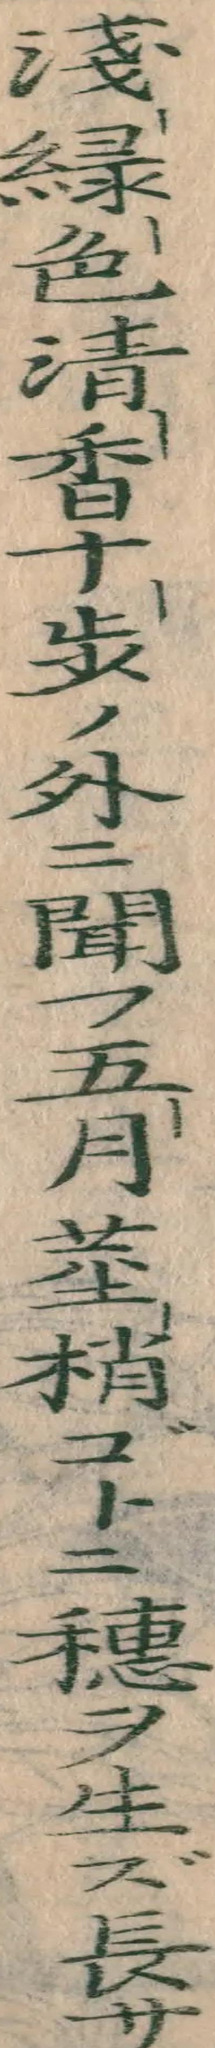浅-緑-色清-香十-歩ノ外ニ聞フ五-月茎-梢ゴトニ穂ヲ生ズ長サ
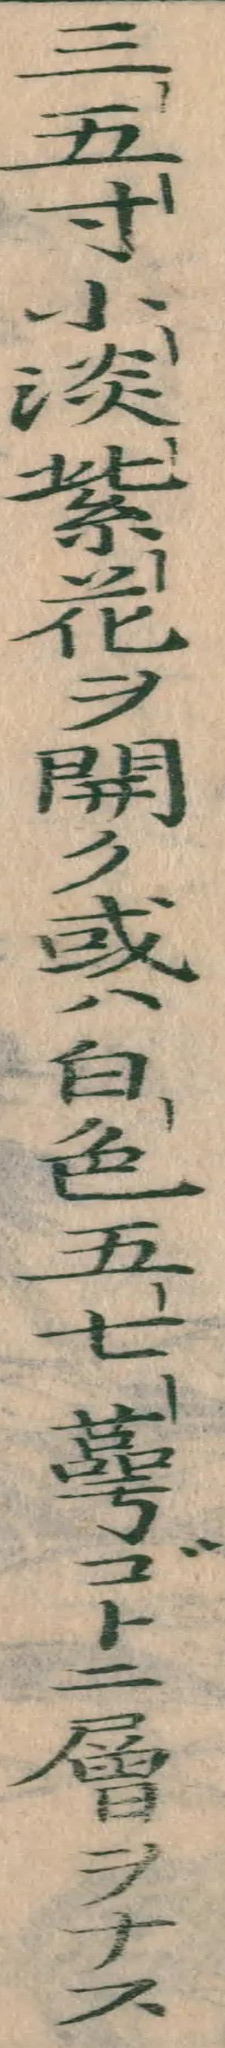三-五-寸小-淡-紫-花ヲ開ク或ハ白-色五-七-萼ゴトニ層ヲナス
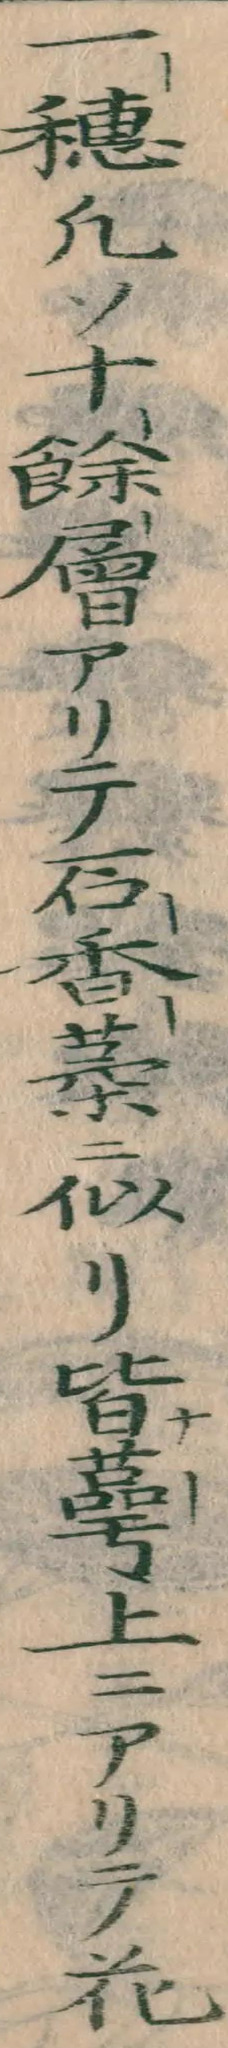一-穂凡ソ十-余-層アリテ石-香-葇ニ似リ皆萼上ニアリテ花
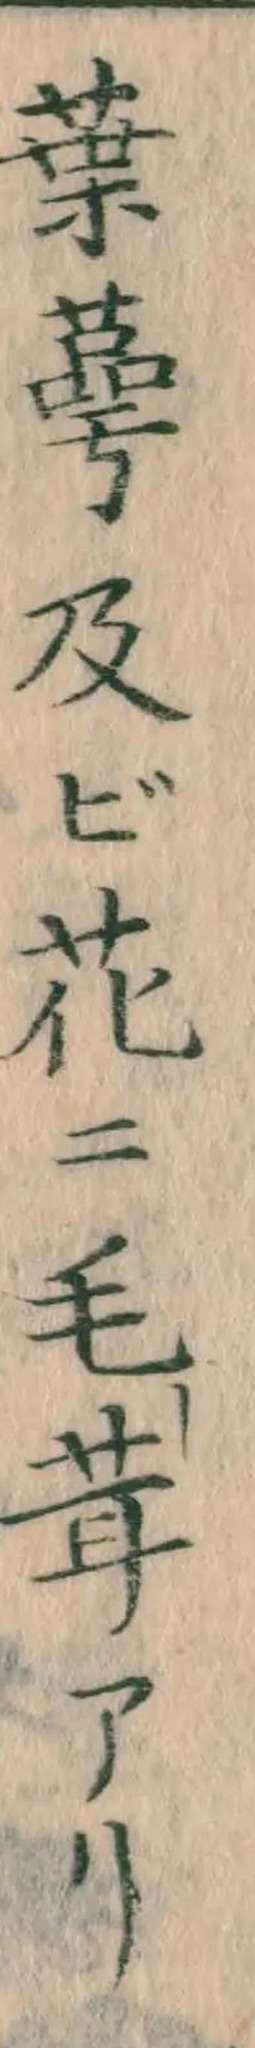葉萼及ビ花ニ毛-茸アリ
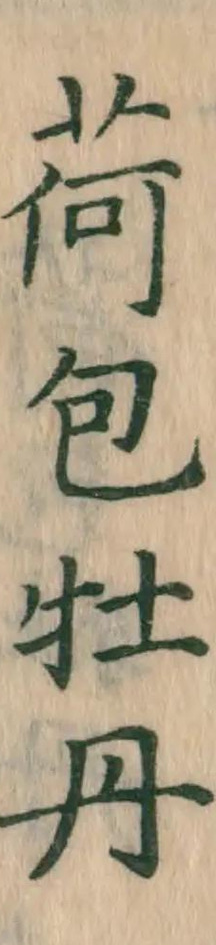荷包牡丹

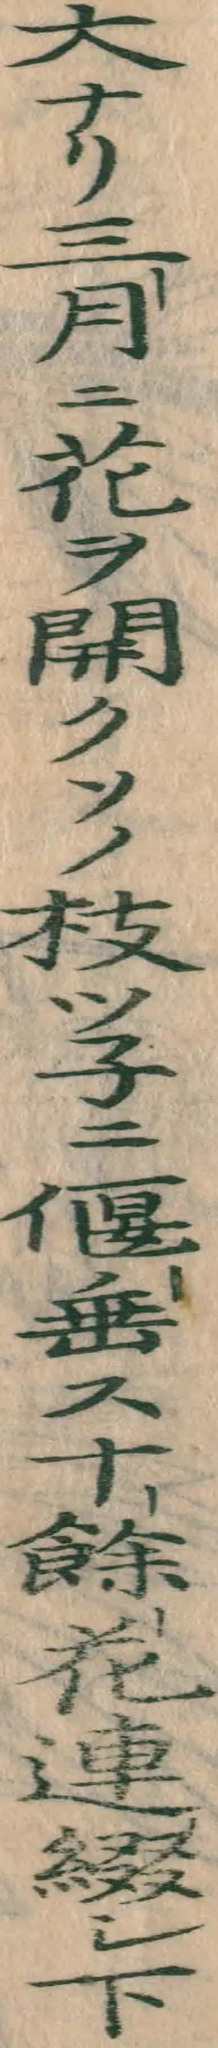大ナリ三-月ニ花ヲ開クソノ枝ツネニ偃-垂ス十-余-花連-綴シ下
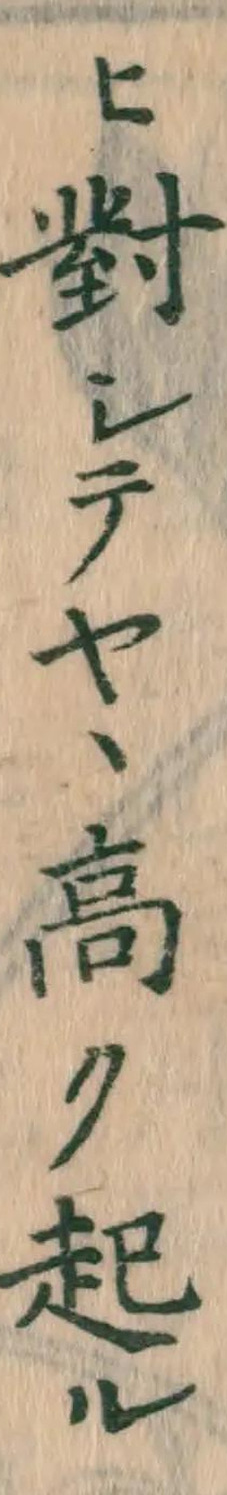ヒ対シテヤヽ高ク起ル
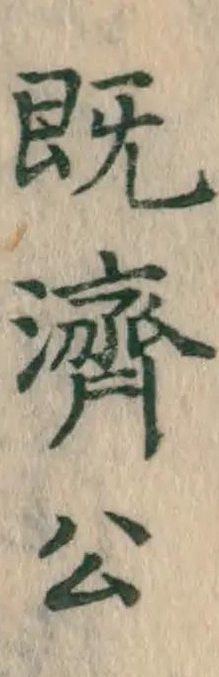既済公

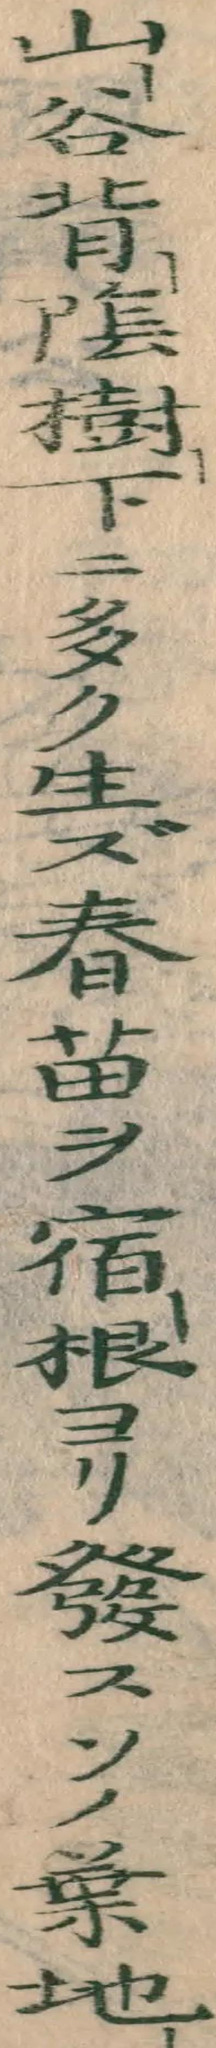山-谷背-陰樹-下ニ多ク生ズ春苗ヲ宿-根ヨリ発スソノ葉地-
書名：花彙 草部4巻木部4巻. [1]
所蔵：国立国会図書館 National Diet Library, JAPAN
